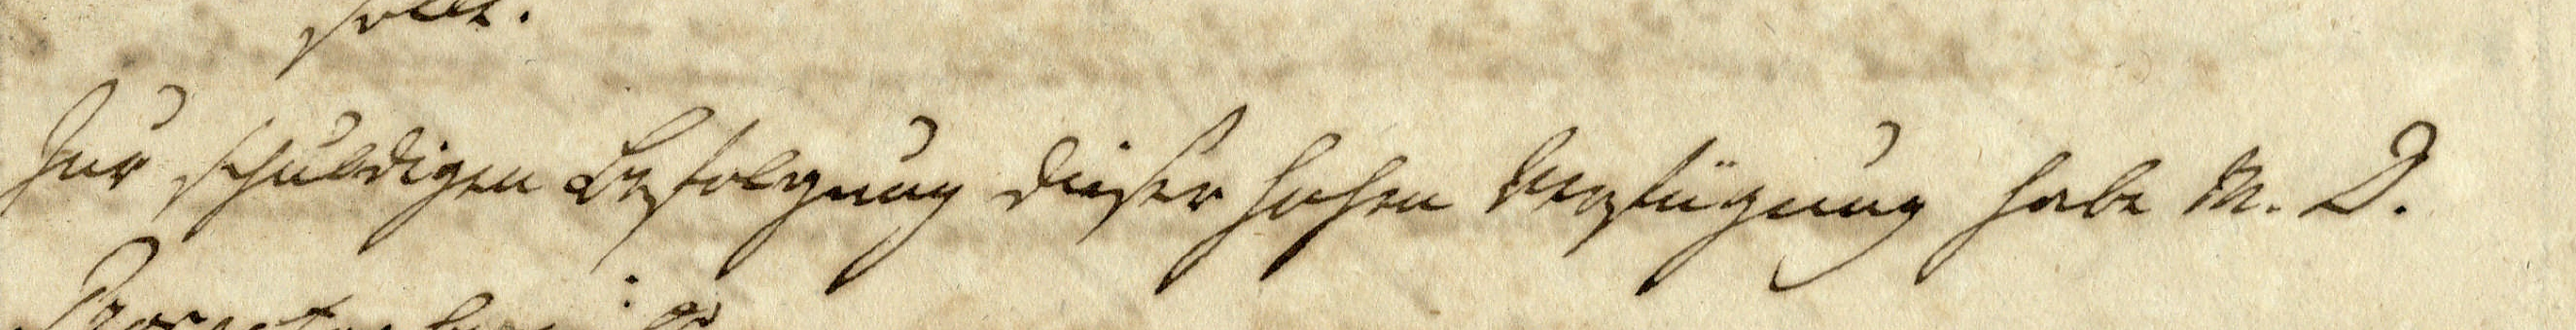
Zur schuldigen Befolgung dieser hohen Verfügung habe M. D.
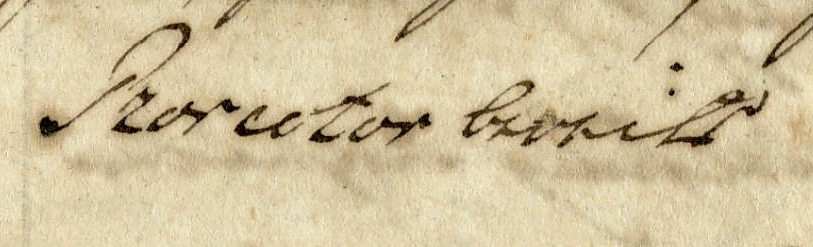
Prorector bereits
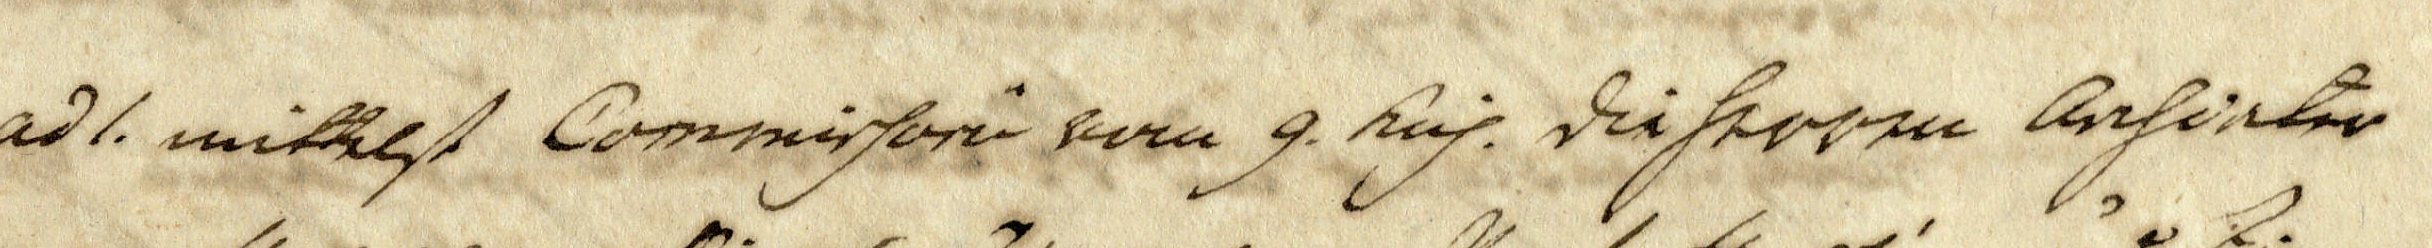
ad 1. mittelst Commissorii vom 9. huj. die Herren Archiater
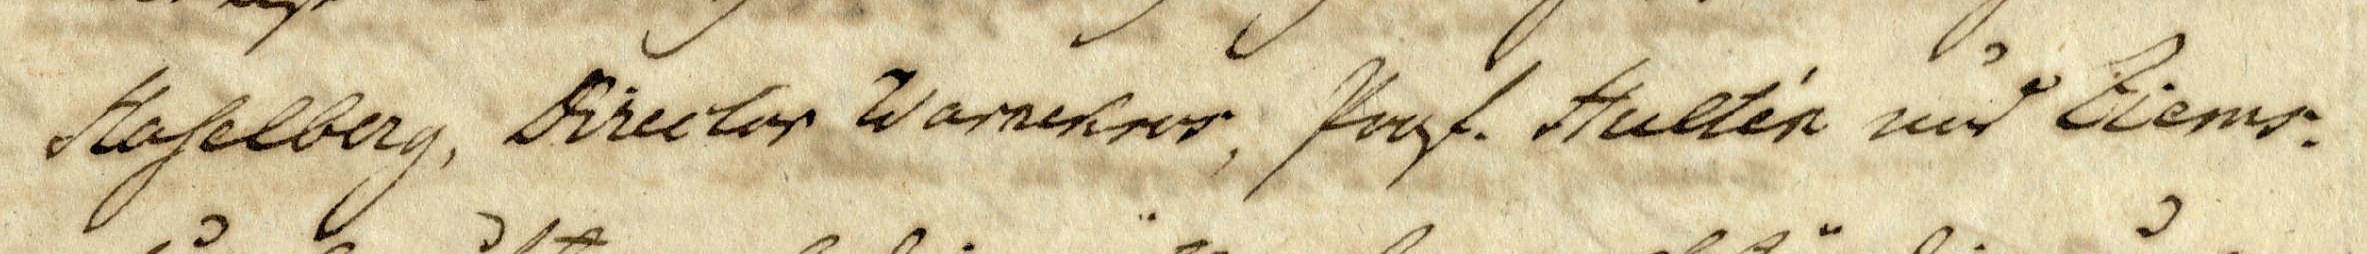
Haselberg, Director Warnekros, Prof. Hultén und Ziems¬
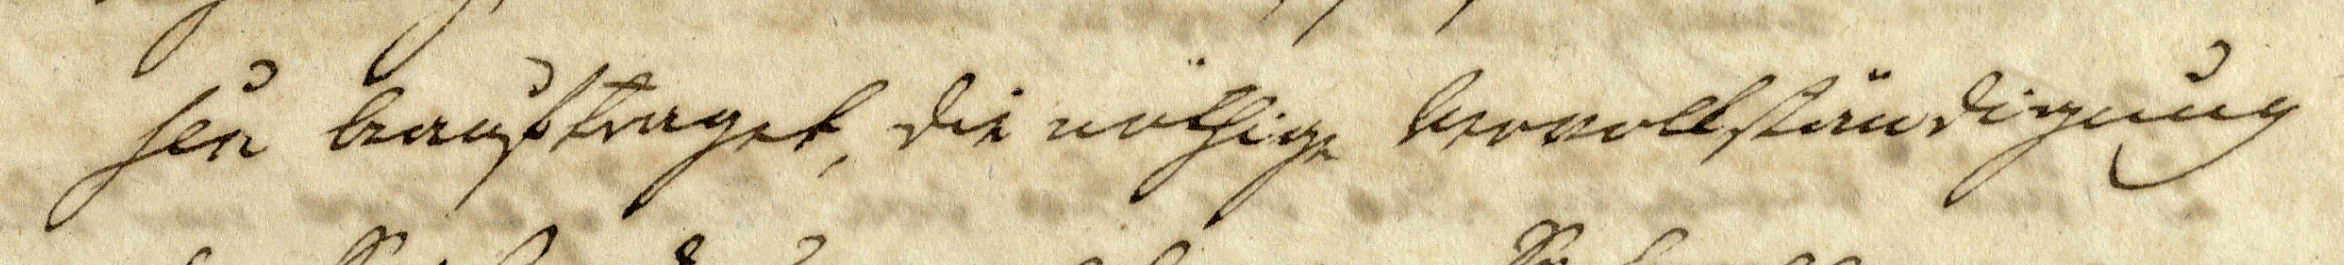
sen beauftraget, die nöthige Vervollständigung
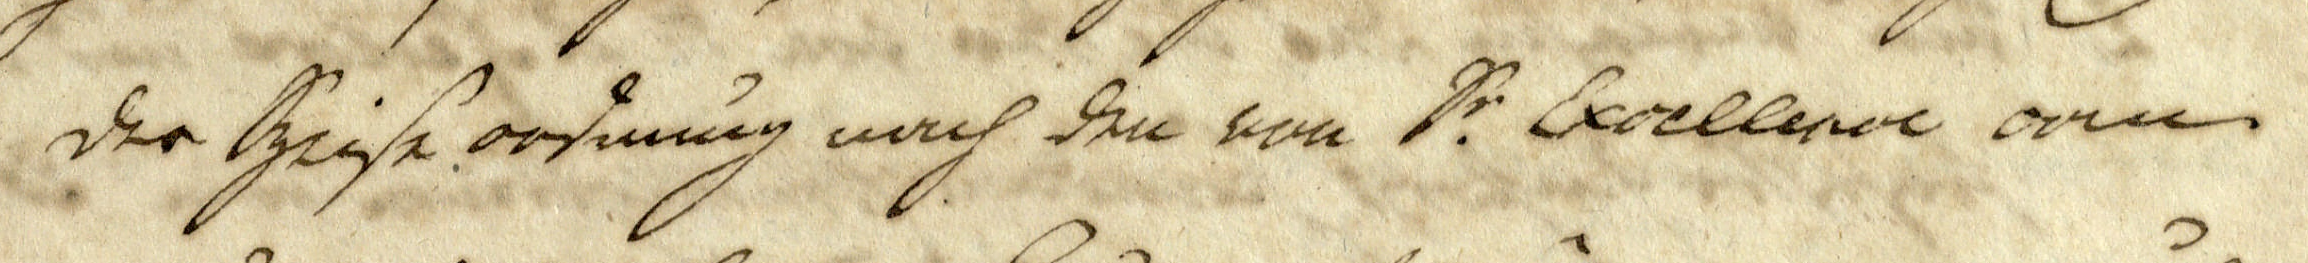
der Speiseordnung nach den von Sr Excellence com¬
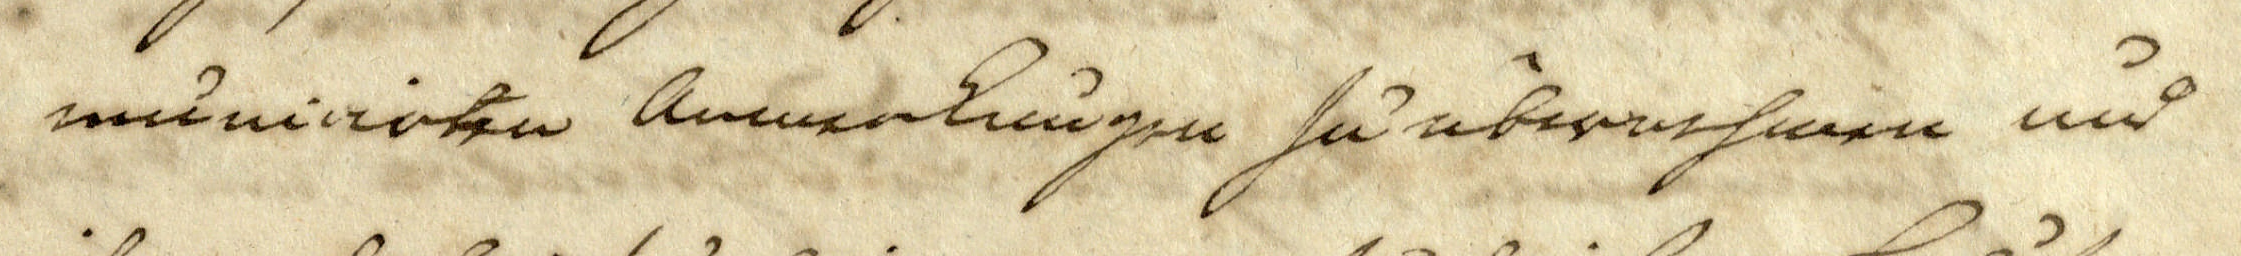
municirten Anmerkungen zu übernehmen und
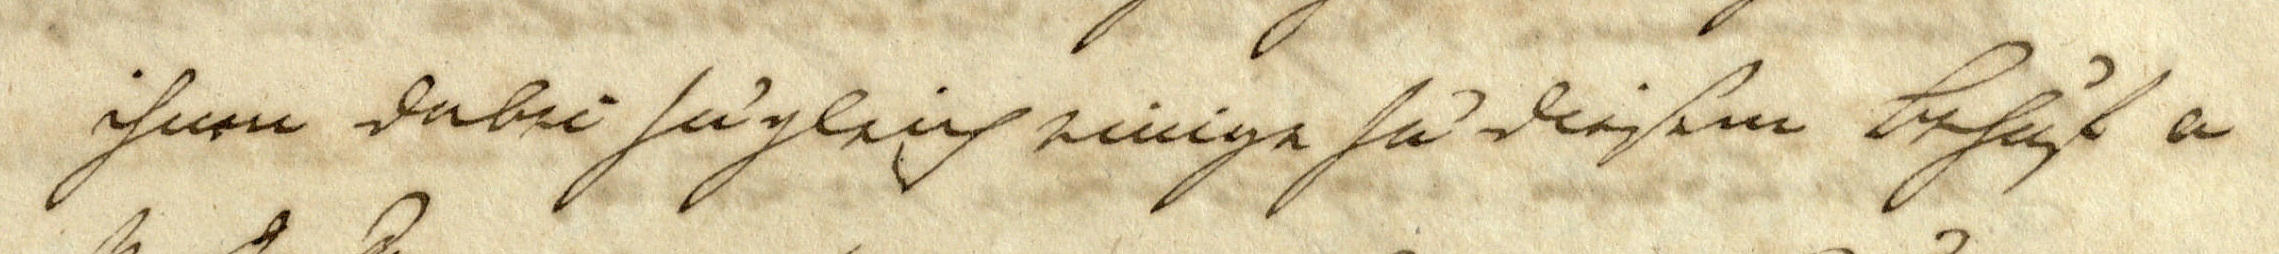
ihnen dabei zugleich einige zu diesem Behuf a
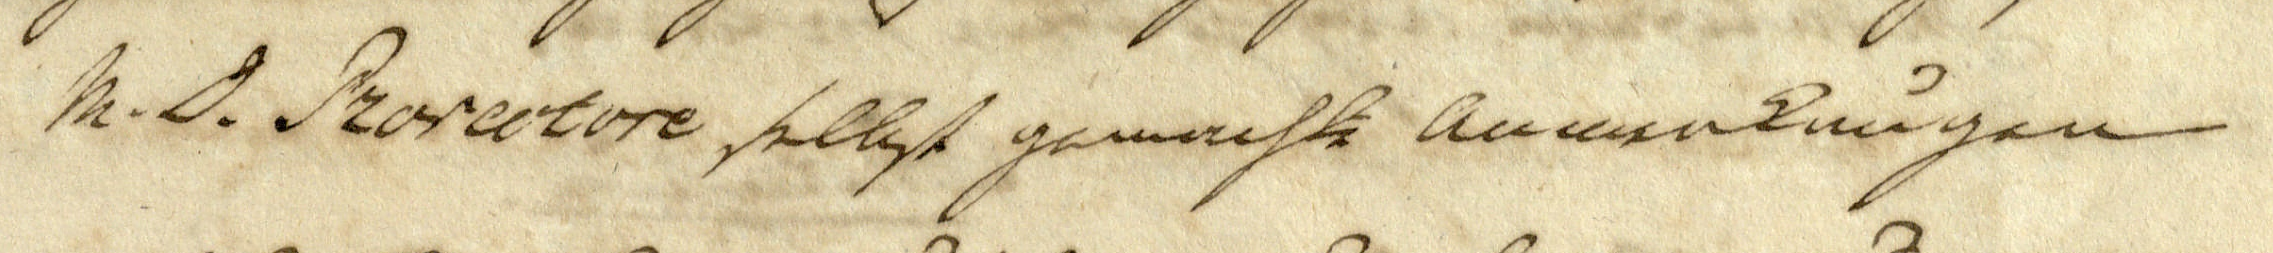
M. D. Prorectore selbst gemachte Anmerkungen
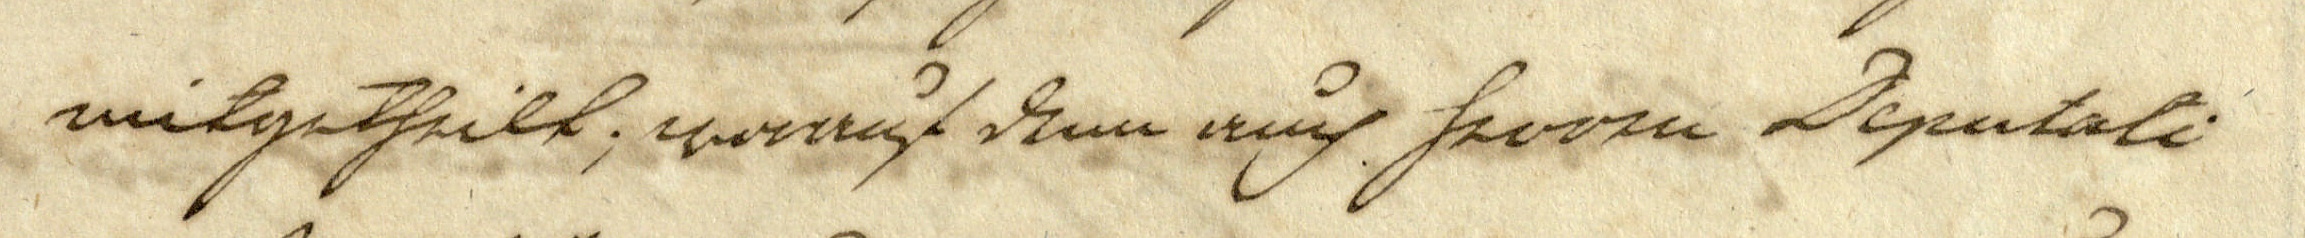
mitgetheilt; worauf denn auch Herren Deputati
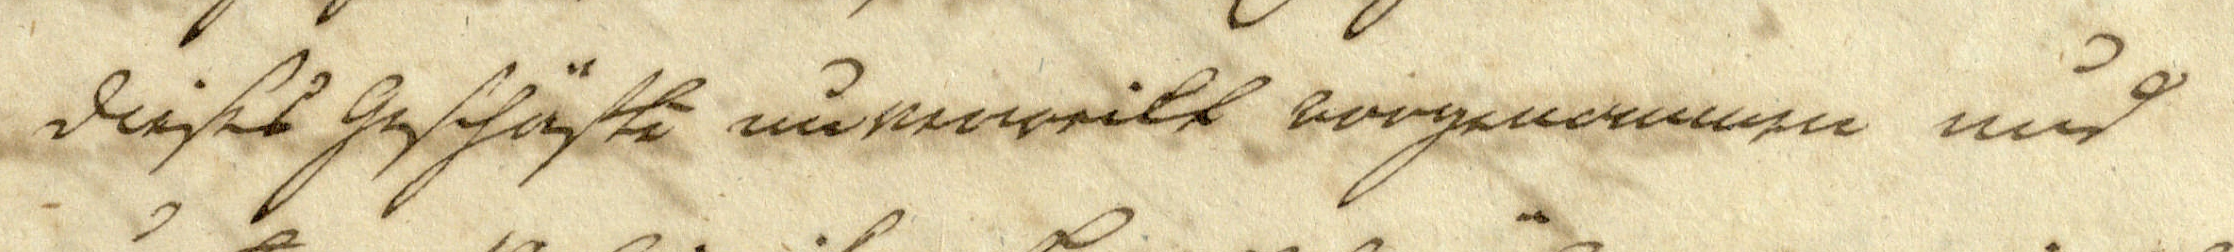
dieses Geschäfte unverweilt vorgenommen und
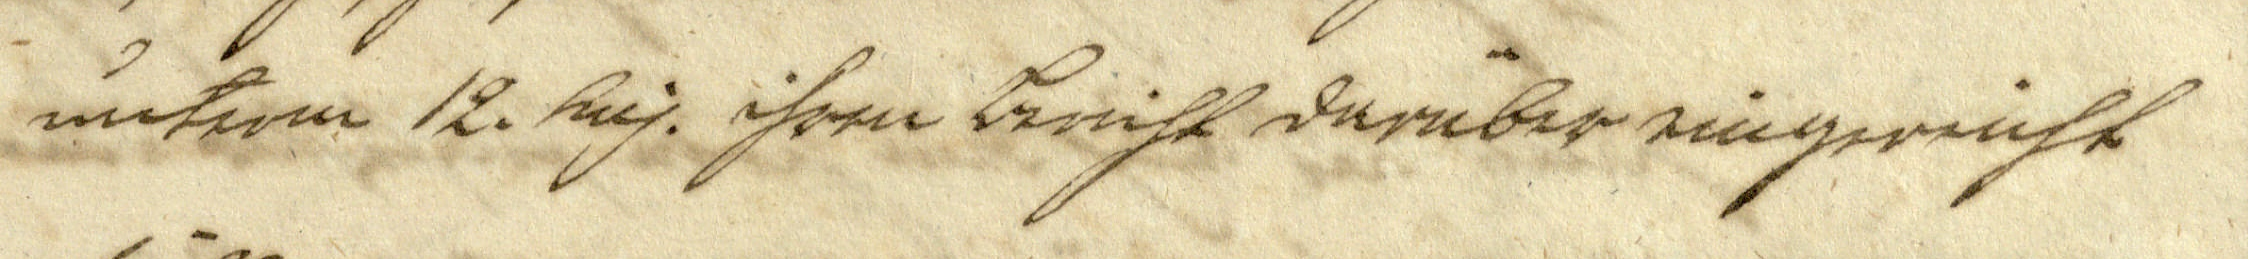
unterm 12. huj. ihren Bericht darüber eingereicht
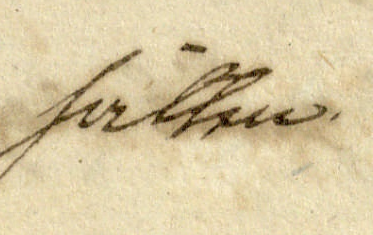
hätten.
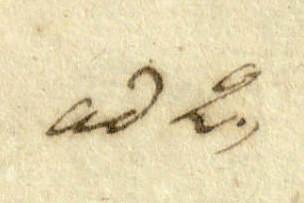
ad 2.,
